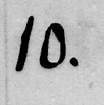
100.
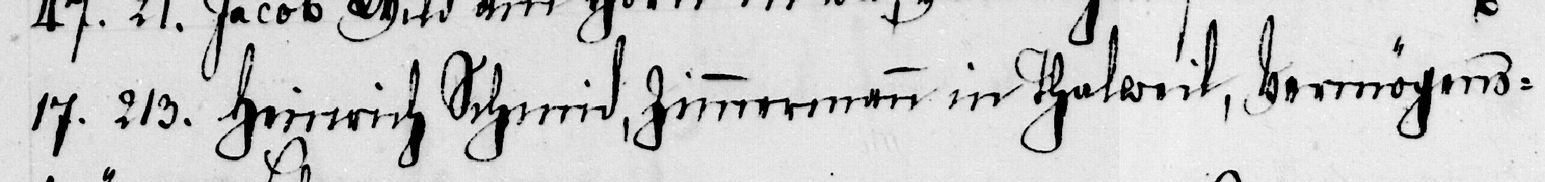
17. 213. Heinrich Schmid, Zimmermann in Thalwil, Vermögens¬
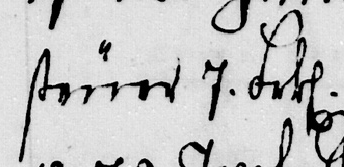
steuer 7. Fr¬
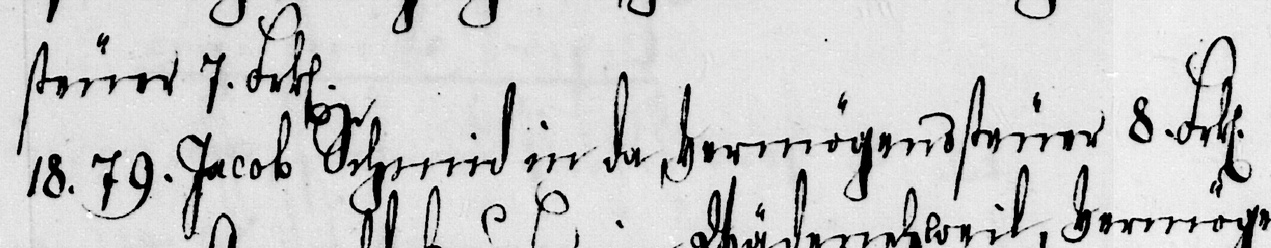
18. 79. Jacob Schmid in da, Vermögenssteuer 8. Fr¬
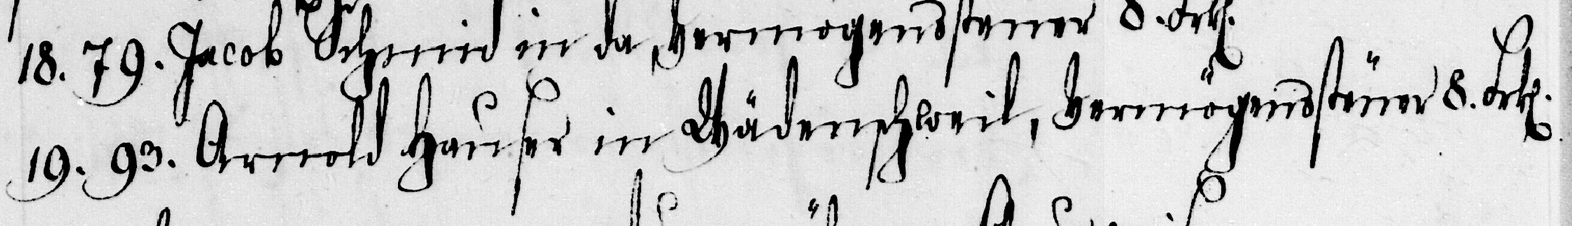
19. 93. Arnold Hauser in Wädenschweil, Vermögenssteuer 8. Fr¬
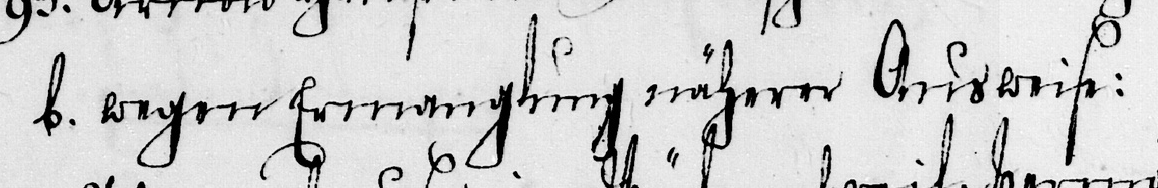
b. wegen Ermanglung näherer Ausweise:
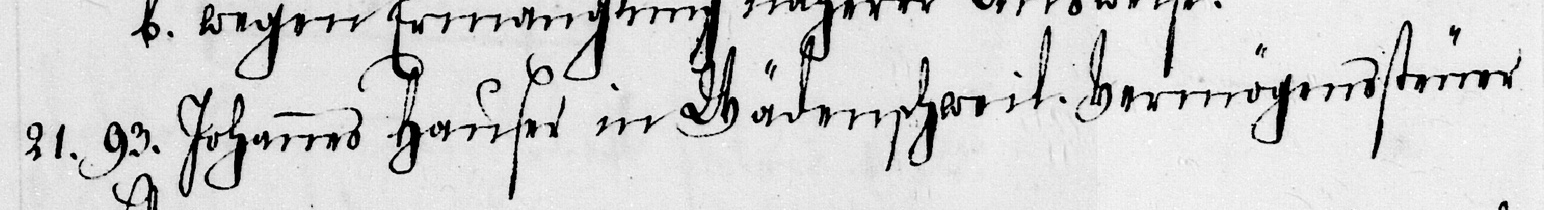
21. 93. Johannes Hauser in Wädenschweil. Vermögenssteuer
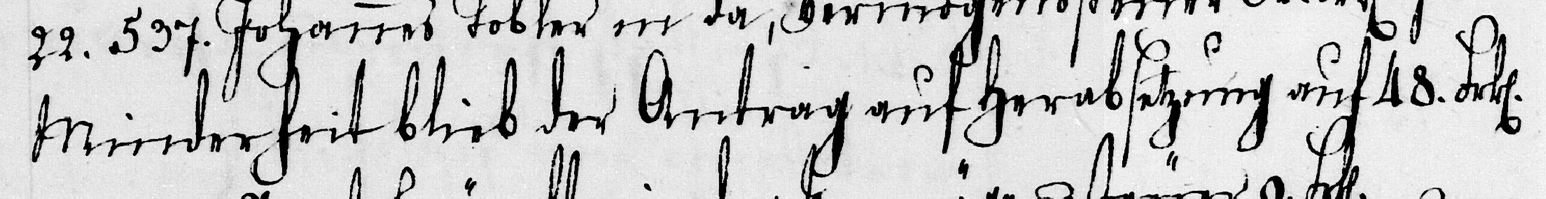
Minderheit blieb der Antrag auf Herabsetzung auf 48. Fr¬
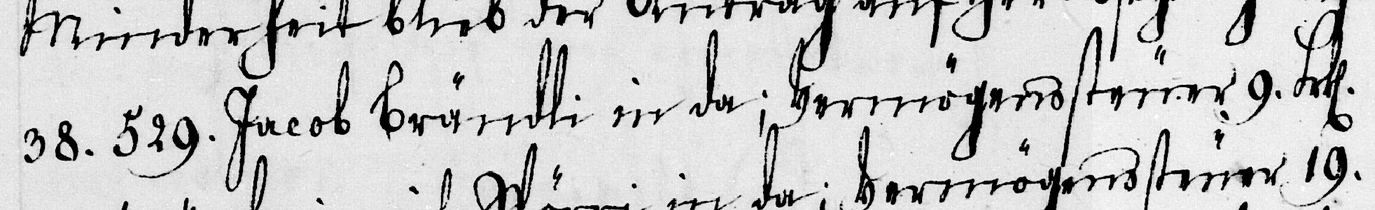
38. 529. Jacob Brändli in da; Vermögenssteuer 9. Fr¬
